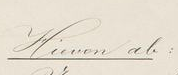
Hievon ab:
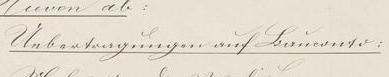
Uebertragungen auf Bauconto:
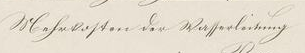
Mehrkosten der Wasserleitung
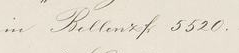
in Bellenz fr 5520.–
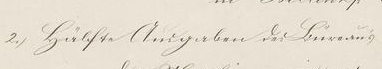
2.) Hälfte Ausgaben des Büreau's
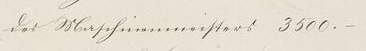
des Maschinenmeisters 3500.–
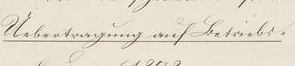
Uebertragung auf Betriebs-
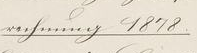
rechnung 1878.
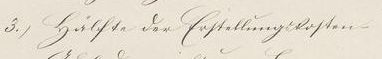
3.) Hälfte der Erstellungskosten –
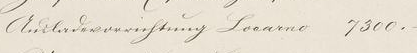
Ausladevorrichtung Locarno 7300.–
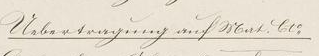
Uebertragung auf Mat. Cto
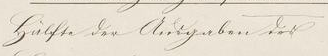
Hälfte der Ausgaben des
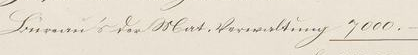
Büreau's der Mat. Verwaltung 7000.–
